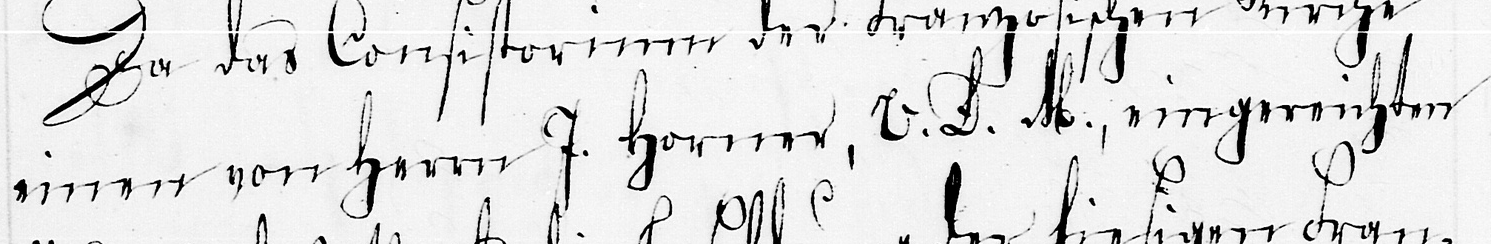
einen von Herrn J. Horner, V. D. M., eingereichten
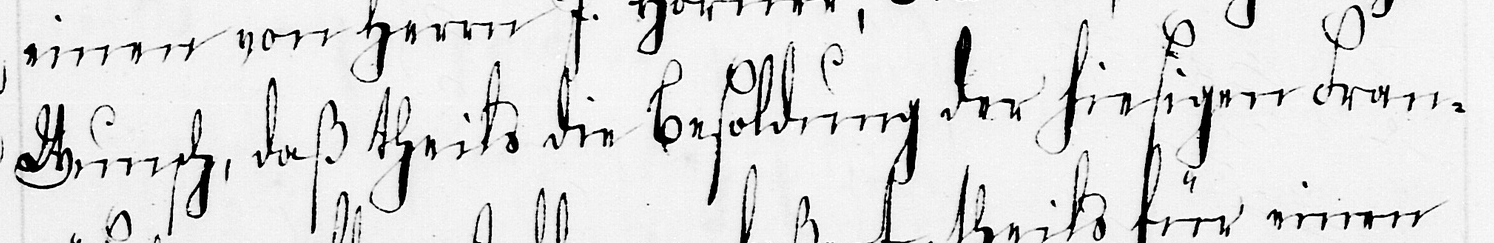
Wunsch, daß theils die Besoldung der hiesigen Fran¬
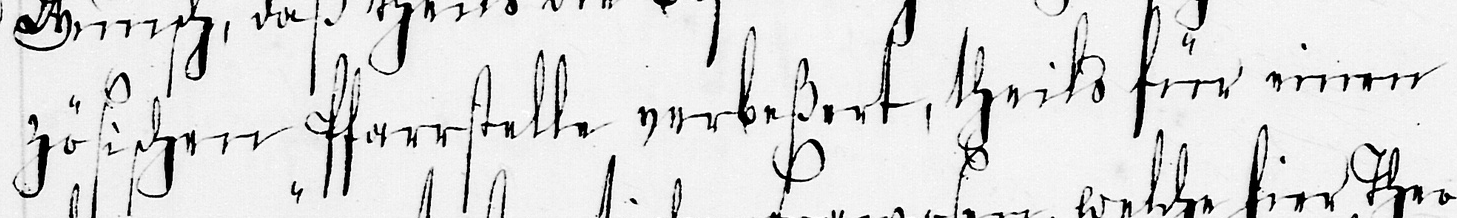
zösischen Pfarrstelle verbeßert, theils für einen
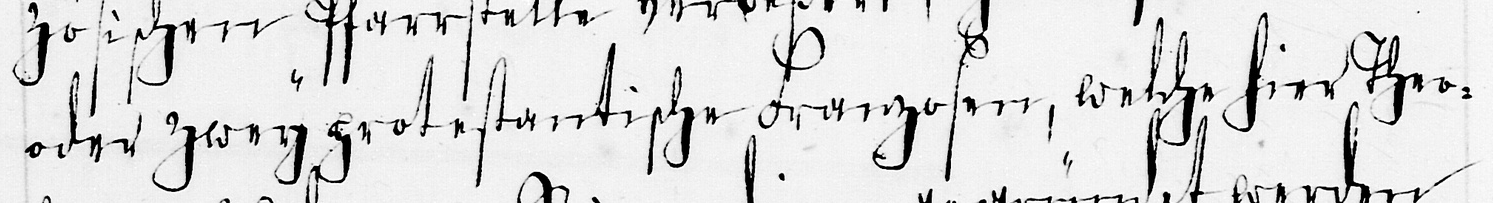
oder zwey protestantische Franzosen, welche hier Theo¬
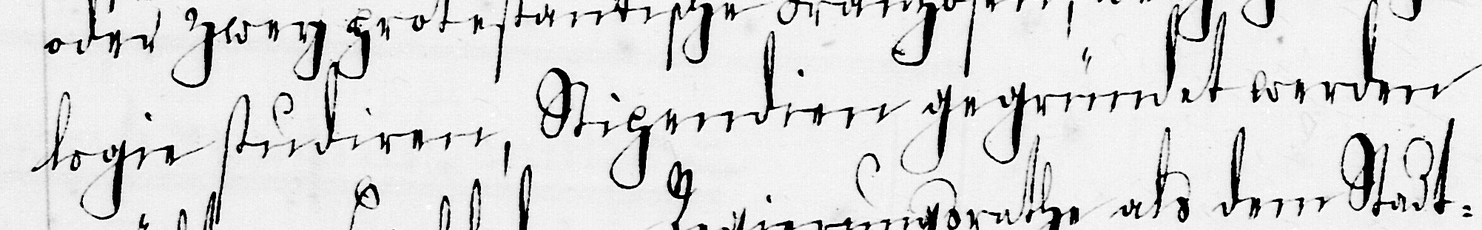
logie studiren, Stipendien gegründet werden
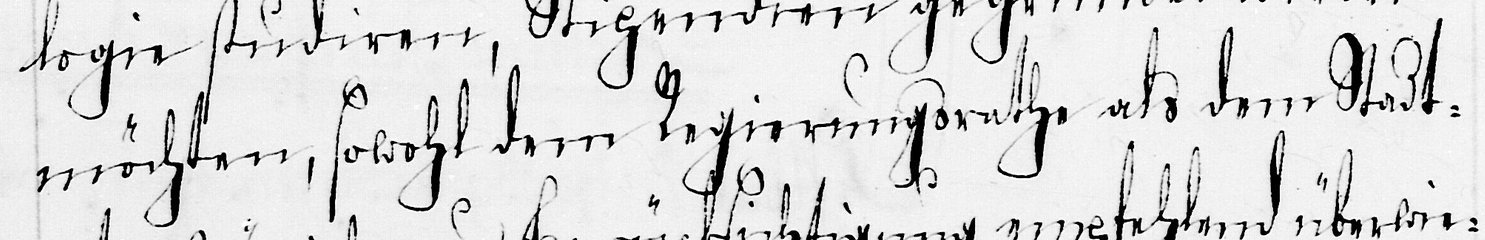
möchten, sowohl dem Regierungsrathe als dem Stadt¬
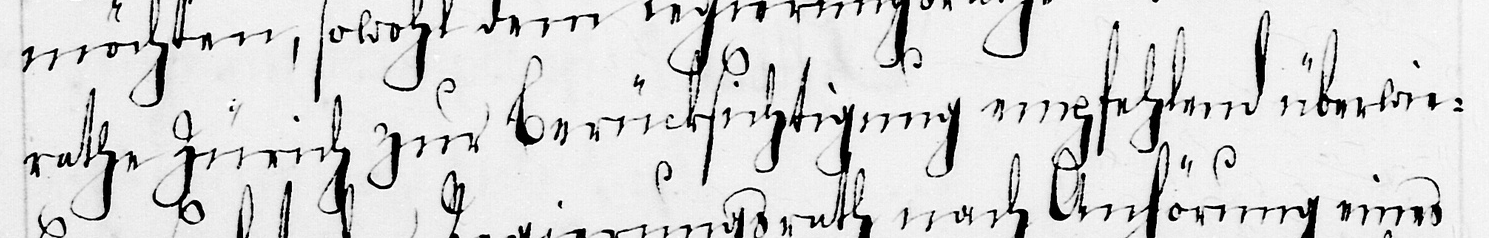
rathe Zürich zur Berücksichtigung empfehlend überwie¬
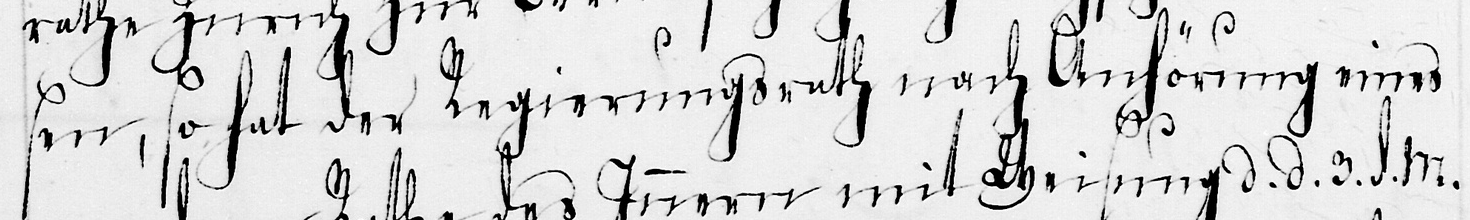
sen, so hat der Regierungsrath nach Anhörung eines
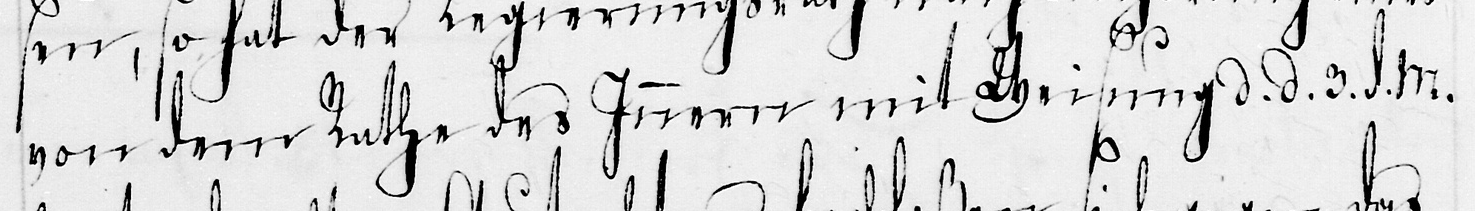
von dem Rathe des Innern mit Weisung d. d. 3. d. M.
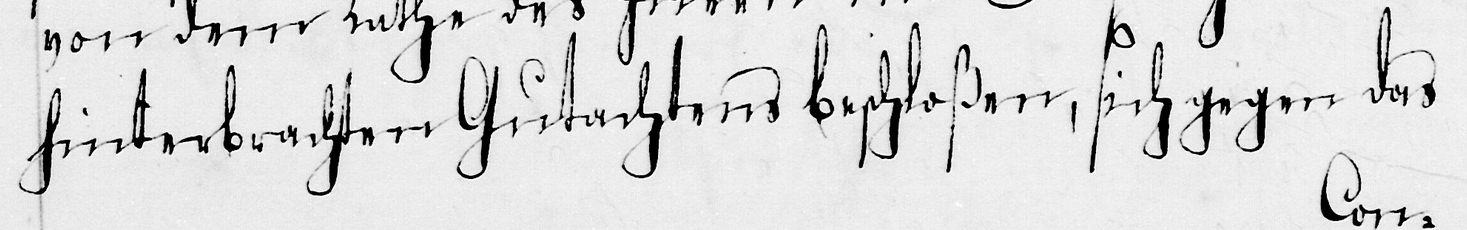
hinterbrachten Gutachtens beschloßen, sich gegen das
